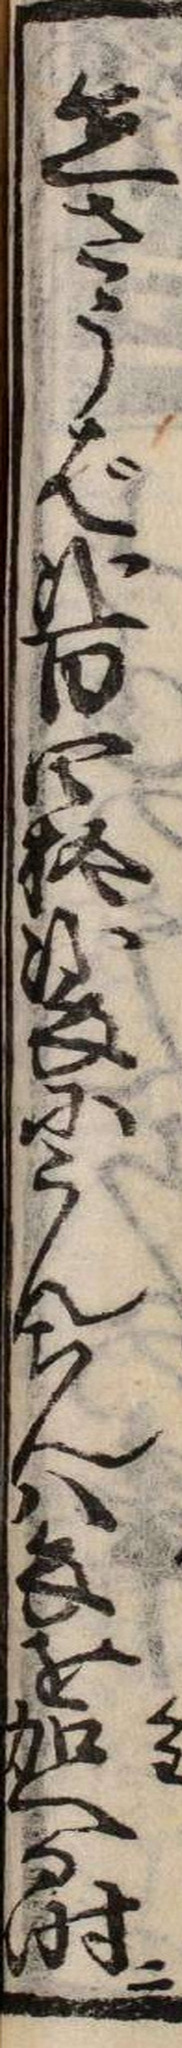先さうば弐百四拾弐匁にうんちん八匁を加へる時に
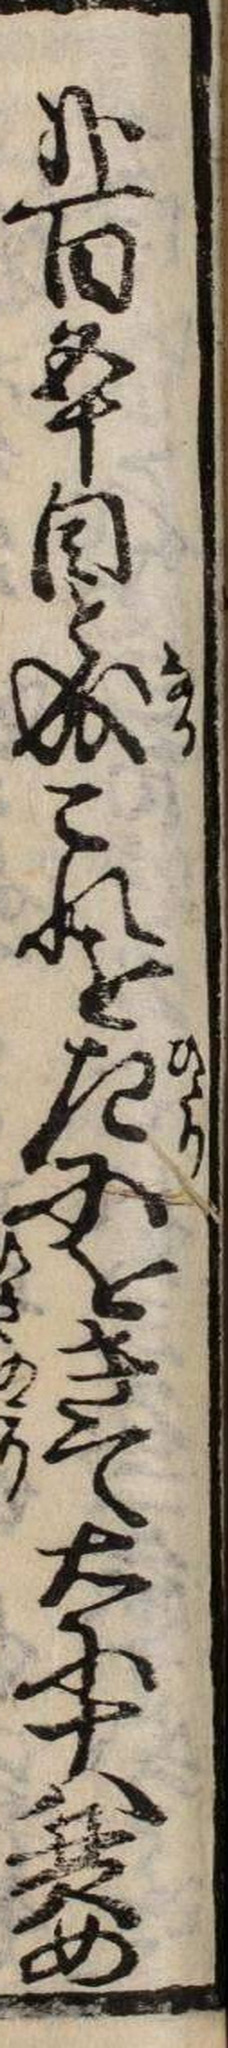弐百五十目と成これを左にをきて右に十八貫め
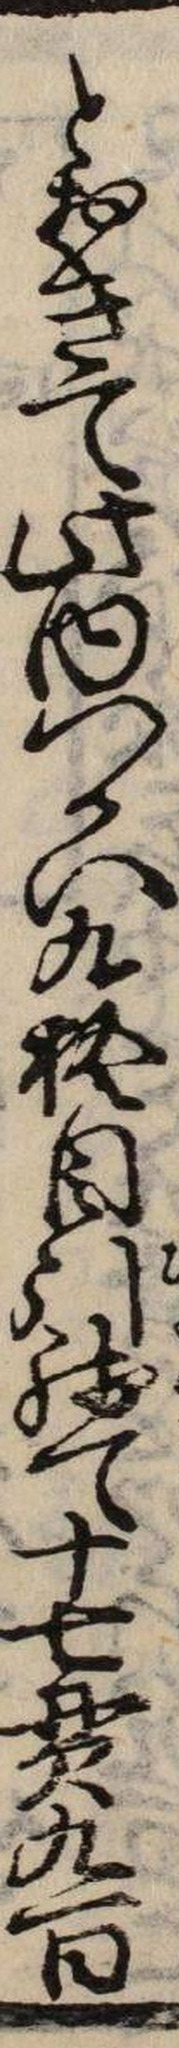とおきて此内つかい九拾目引残て十七貫九百
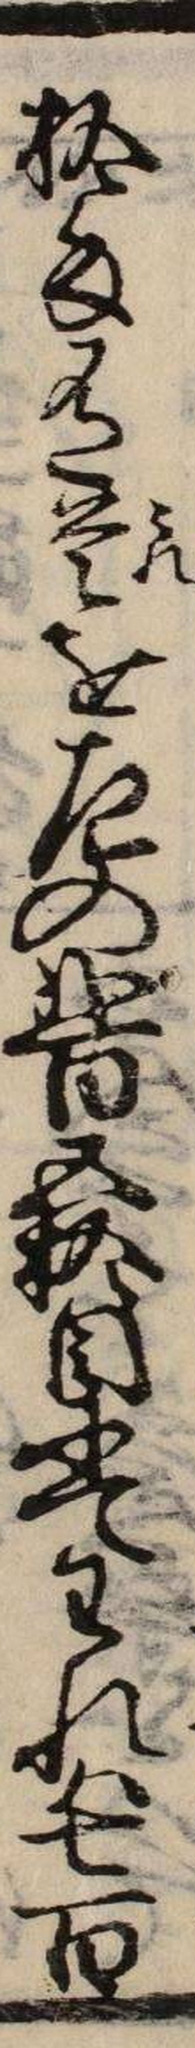拾匁有是を左の弐百五拾目にてわれは七百
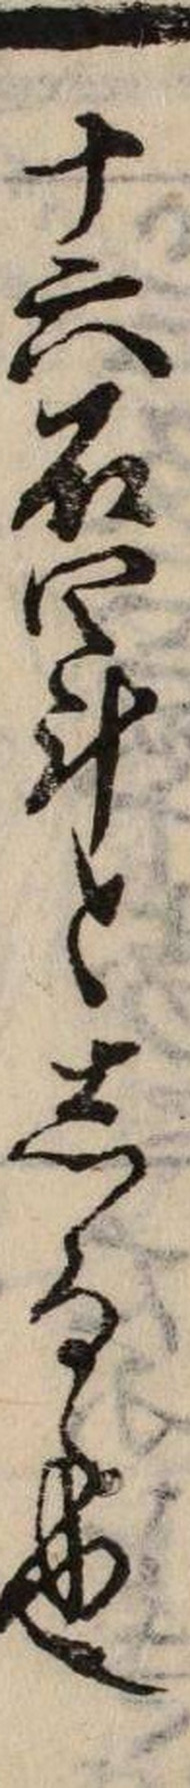十六石四斗としる也
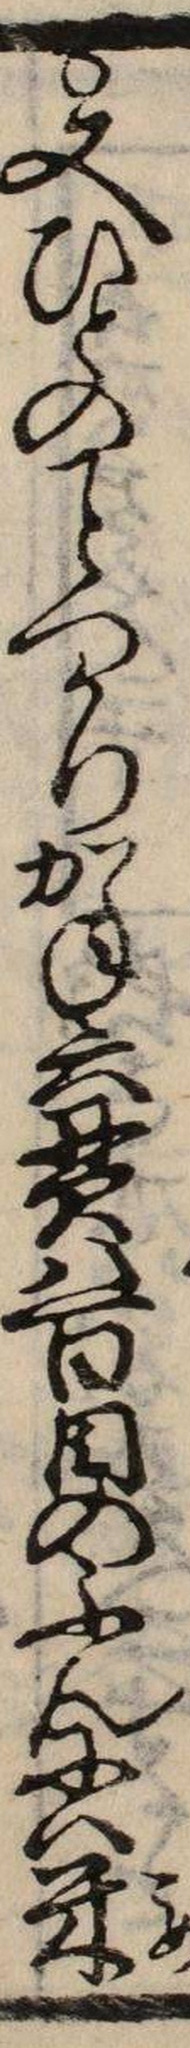○又ひとのことつかりかね六貫八百目のふんには米
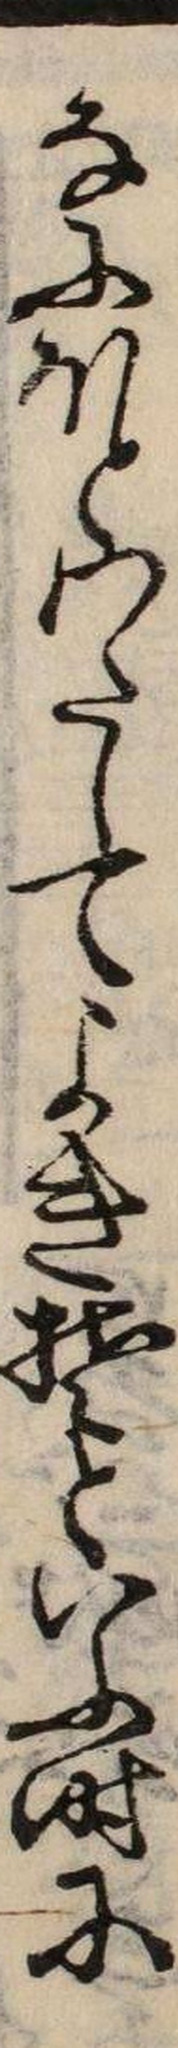なにほとわたてよきそといふ時に
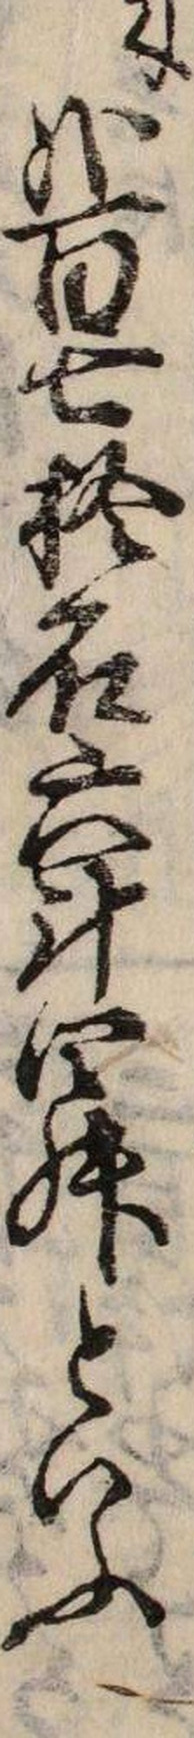米弐百七拾石六斗四升といふ
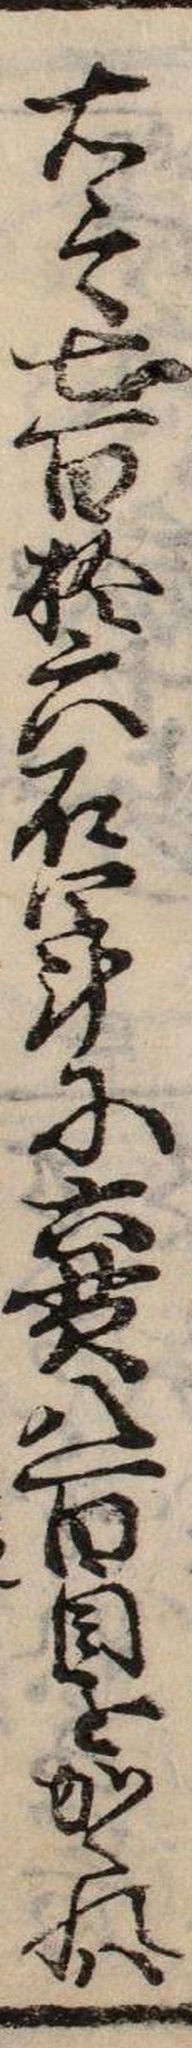右之七百拾六石四斗に六貫八百目をかくれは
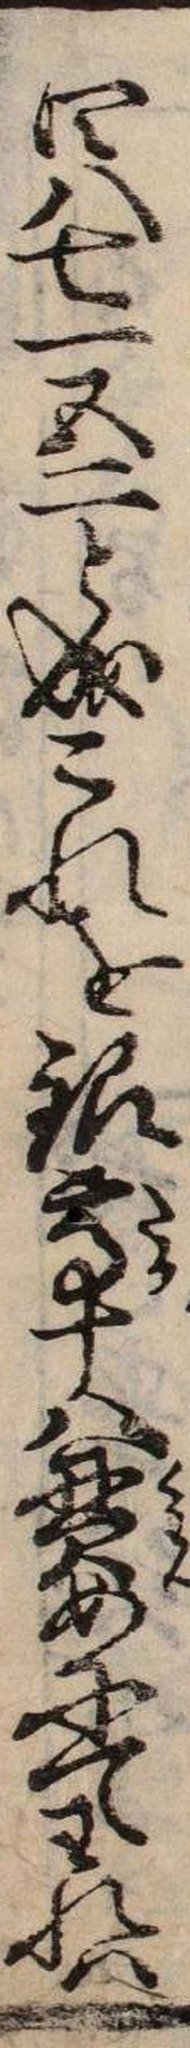四八七一五二と成これを銀高十八貫めにてわれは
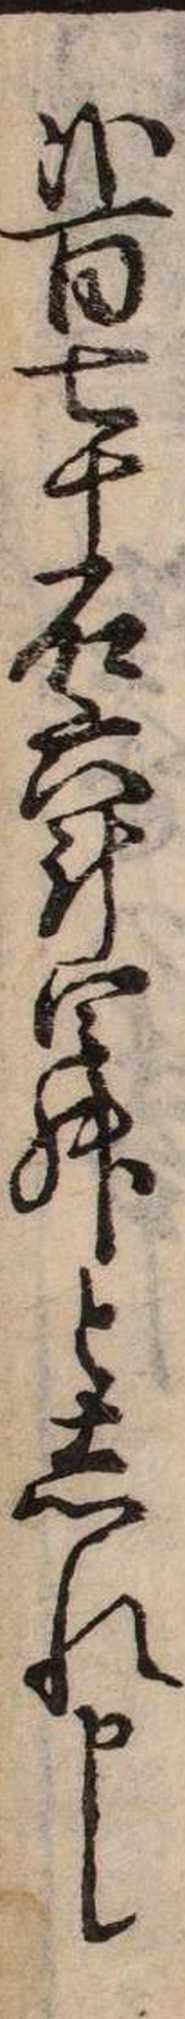弐百七十石六斗四升としれ申候

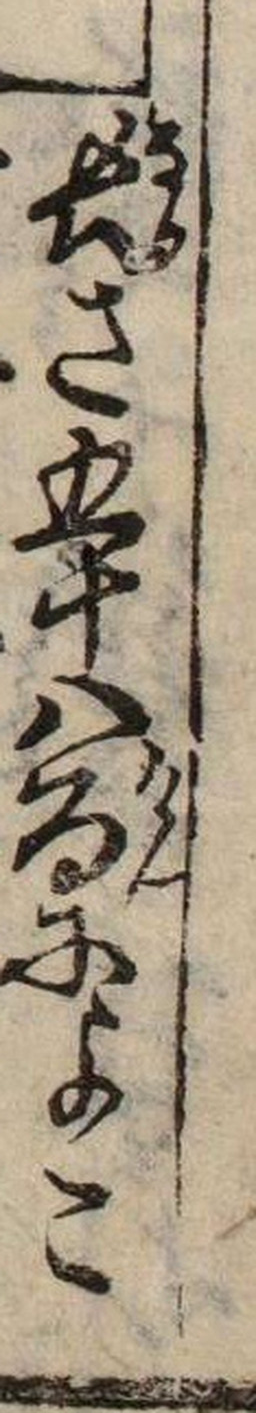長さ五十八間によこ
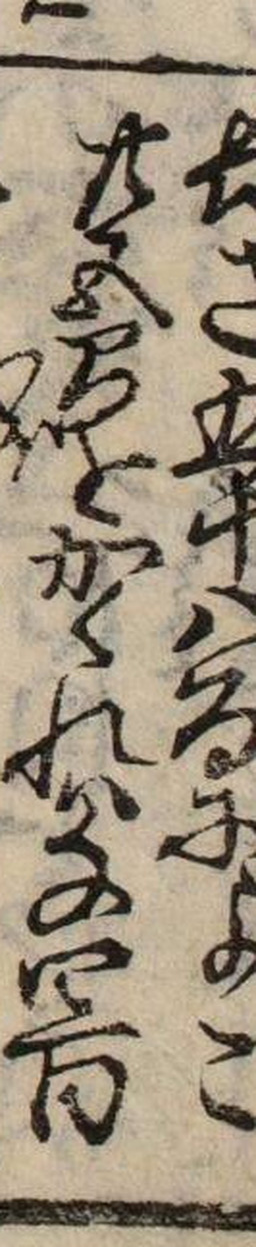廿五尺をかくれは千四百
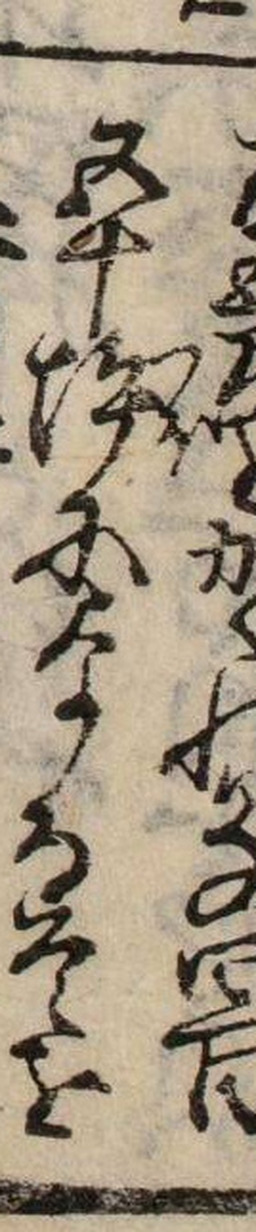五十坪になる是
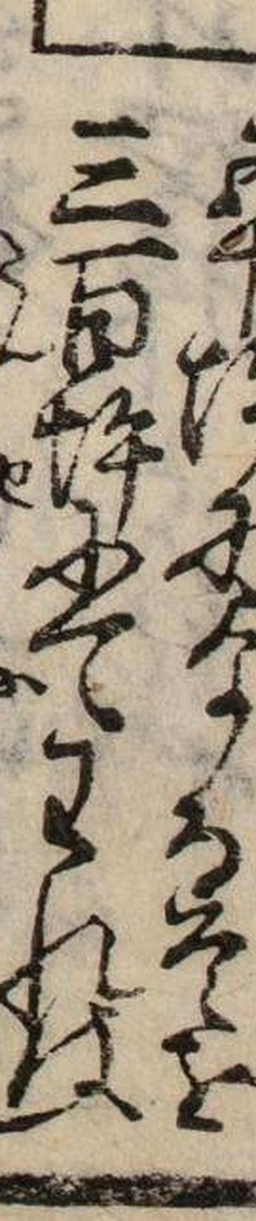三百坪にてわれは
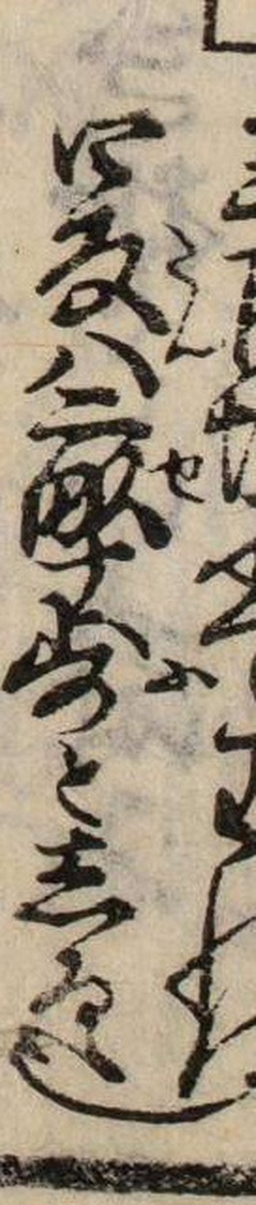四反二畝十歩としるる也
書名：塵劫記（寛永11年自跋、京都府立京都学・歴彩館追貴8）
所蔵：京都府立京都学・歴彩館 国文学研究資料館
